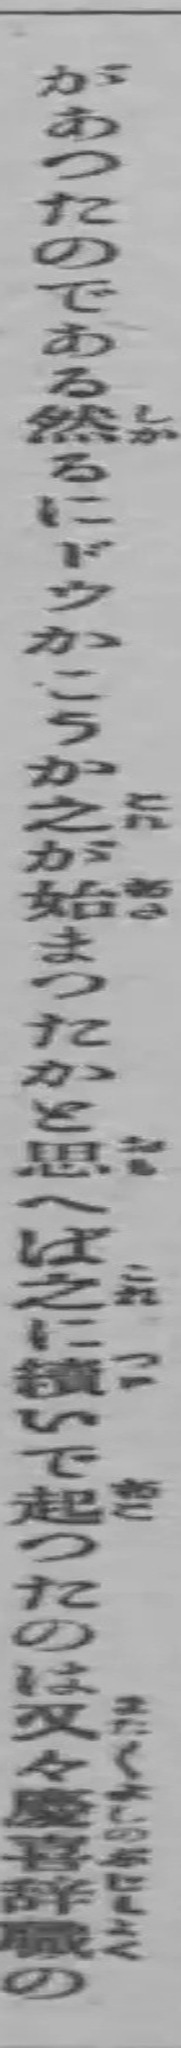があつたのである然るにドウかこうか之が始まつたかと思へば之に続いて起つたのは又々慶喜辞職の
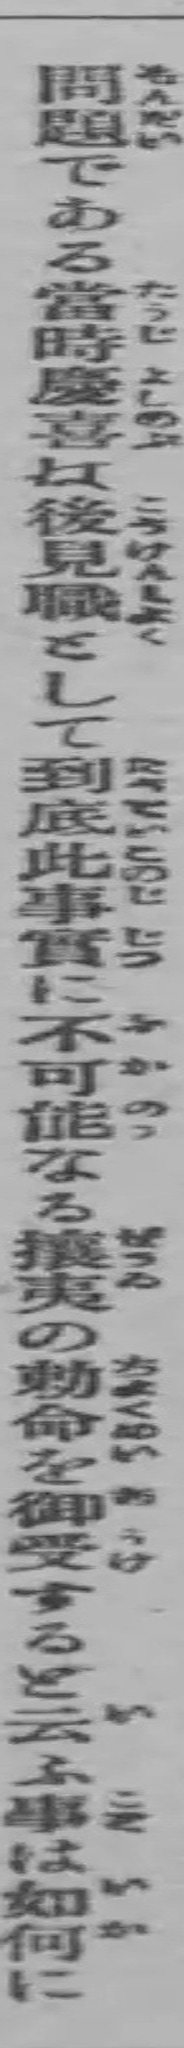問題である当時慶喜は後見職として到底此事実に不可能なる攘夷の勅命を御受すると云ふ事は如何に
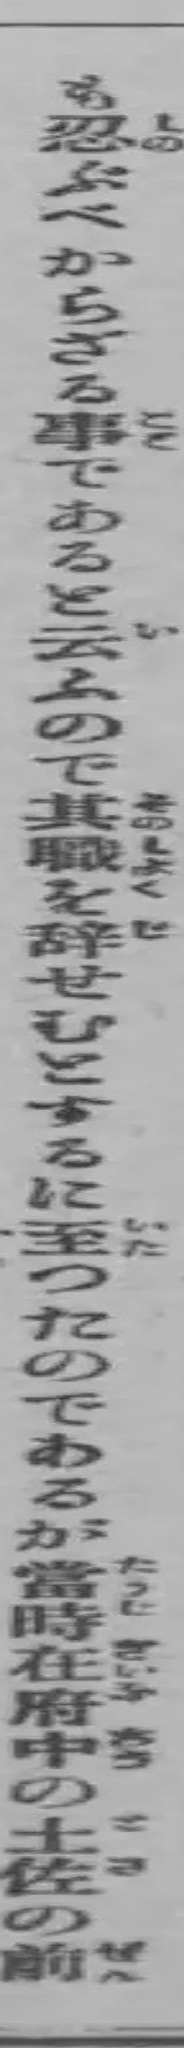も忍ぶべからざる事であると云ふので其職を辞せむとするに至つたのであるが当時在府中の土佐の前
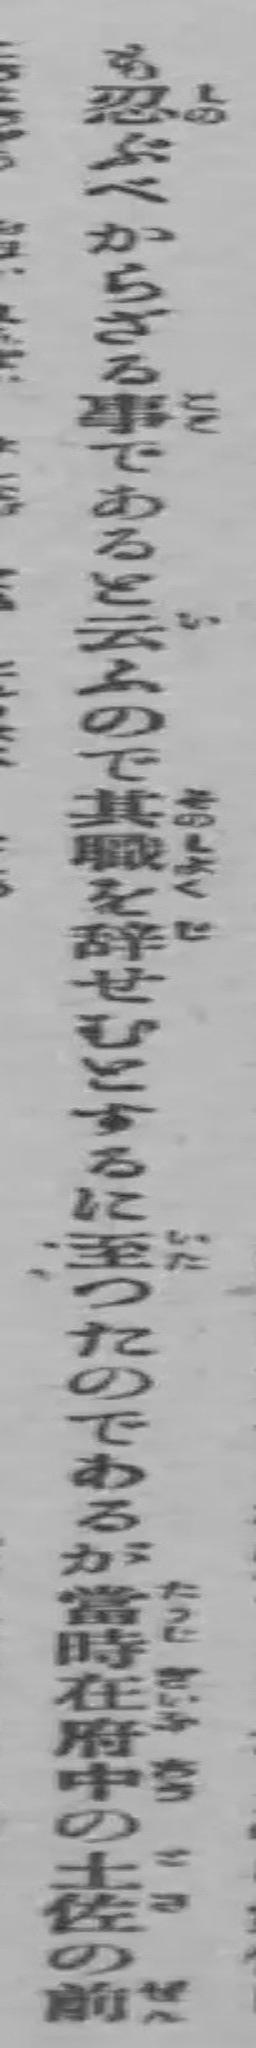も忍ぶべからざる事であると云ふので其職を辞せむとするに至つたのであるが当時在府中の土佐の前
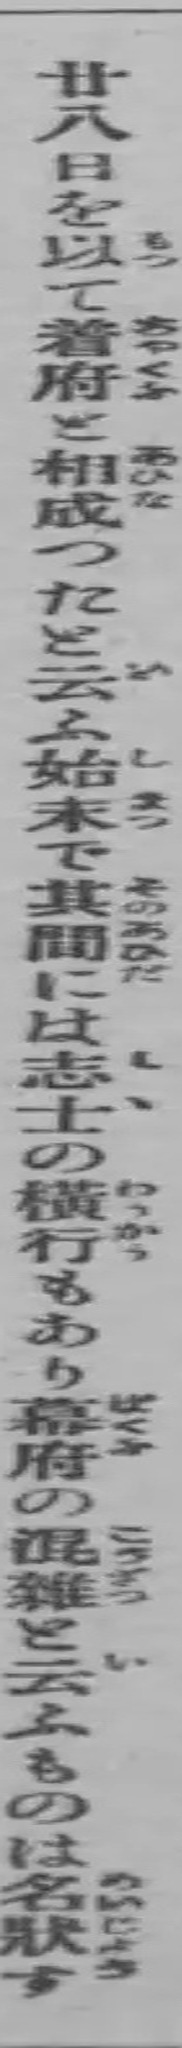廿八日を以て着府と相成つたと云ふ始末で其間には志士の横行もあり幕府の混雑と云ふものは名状す
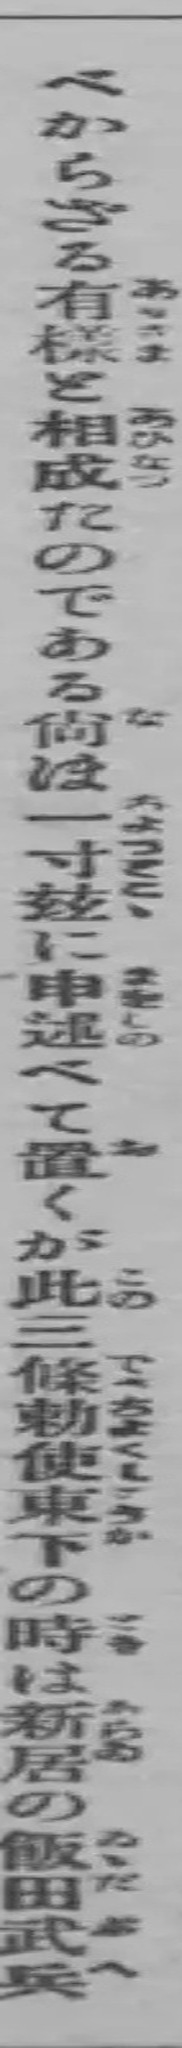べからざる有様と相成たのである尚ほ一寸茲に申述べて置くが此三條勅使東下の時は新居の飯田武兵
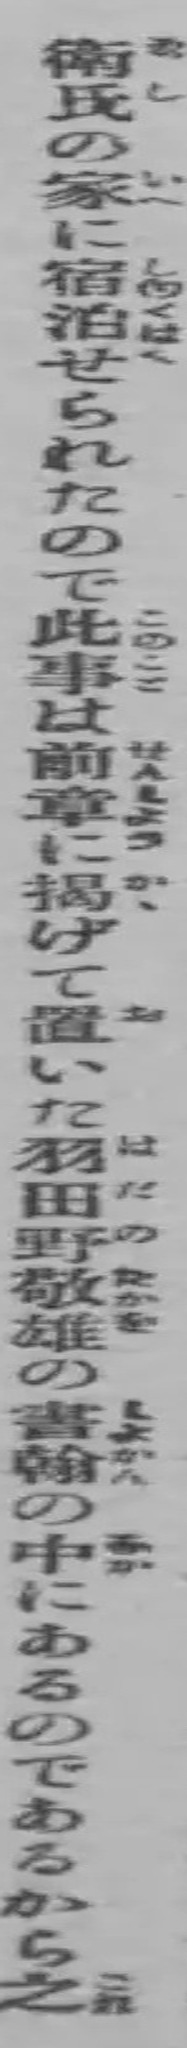衛氏の家に宿泊せられたので此事は前章に掲げて置いた羽田野敬雄の書翰の中にあるのであるから之
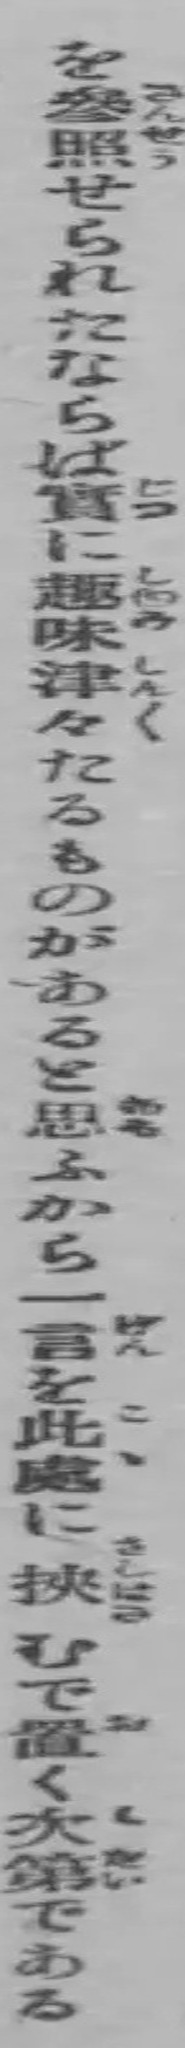を参照せられたならば実に趣味津々たるものがあると思ふから一言を此処に挟むで置く次第である
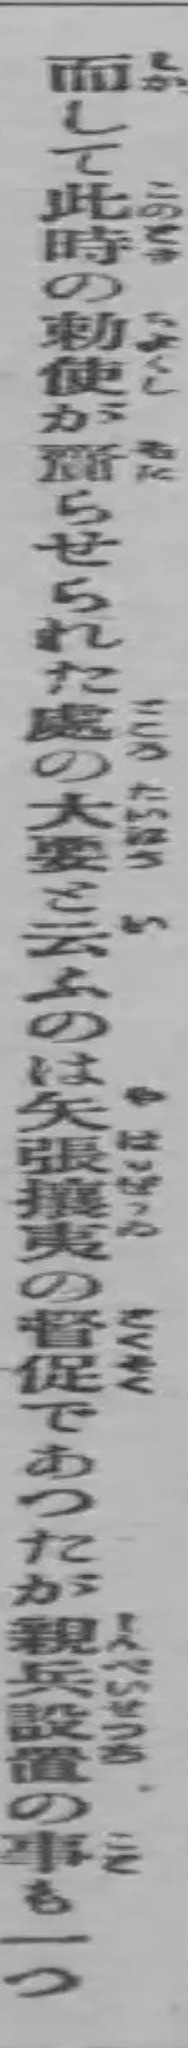而して此時の勅使が齎らせられた処の大要と云ふのは矢張攘夷の督促であつたが親兵設置の事も一つ
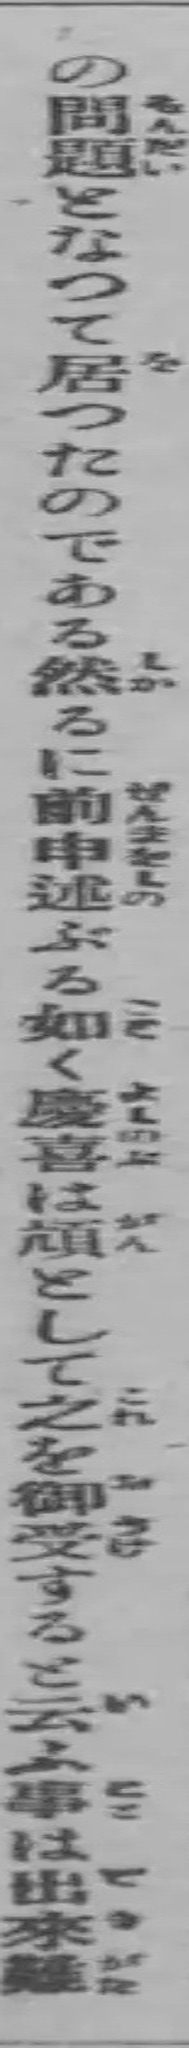の問題となつて居つたのである然るに前申述ぶる如く慶喜は頑として之を御受すると云ふ事は出来難
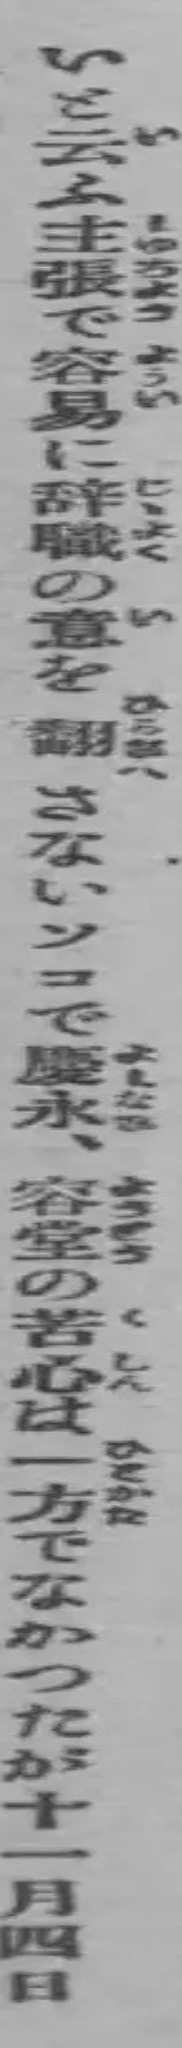いと云ふ主張で容易に辞職の意を翻さないソコで慶永、容堂の苦心は一方でなかつたが十一月四日

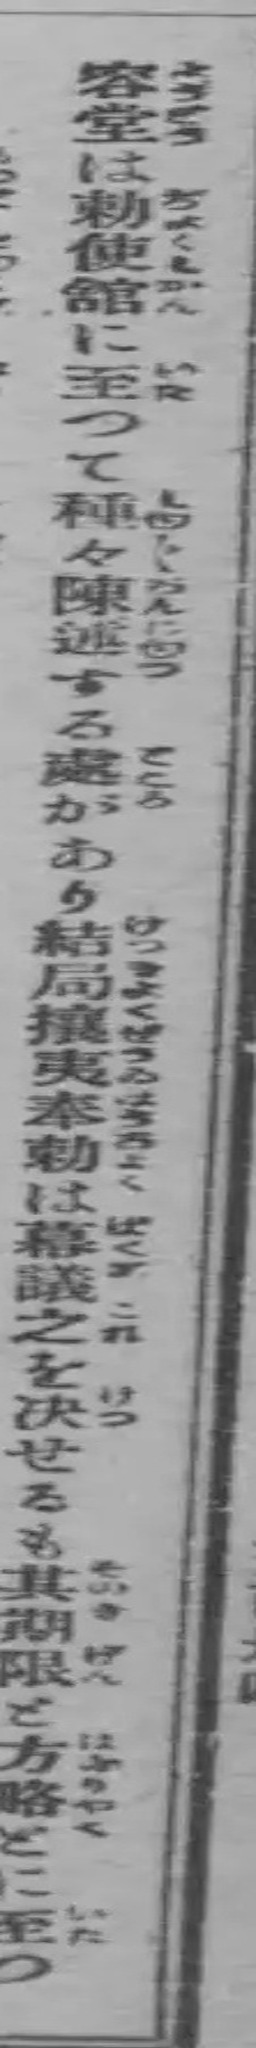容堂は勅使館に至つて種々陳述する処があり結局攘夷奉勅は幕議之を決せるも其期限と方略とに至つ
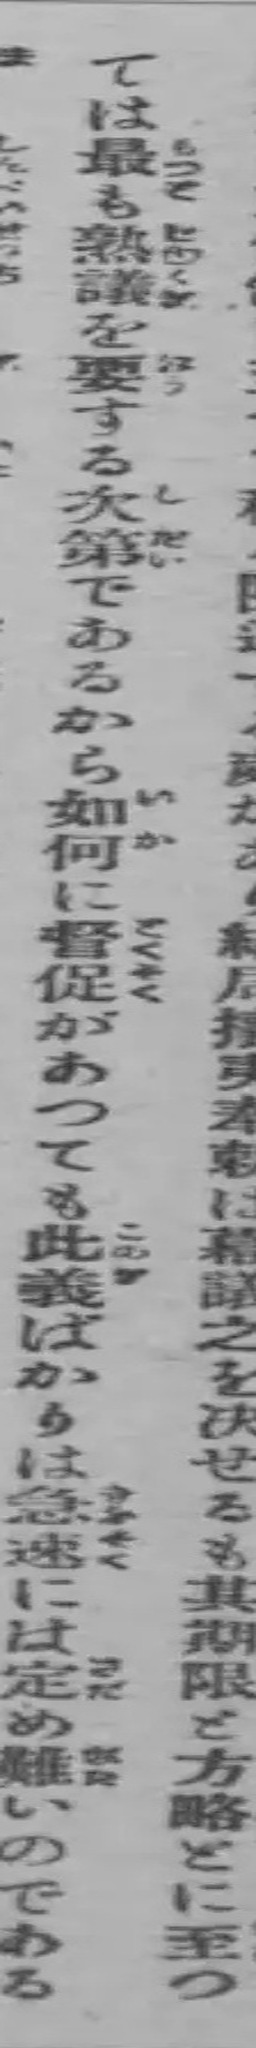ては最も熟議を要する次第であるから如何に督促があつても此義ばかりは急速には定め難いのである
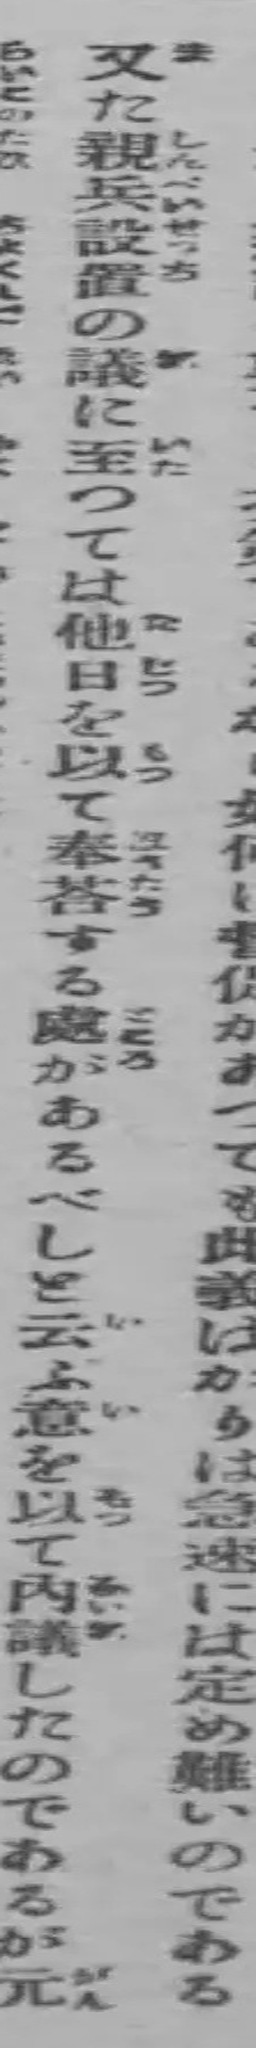又た新兵設置の議に至つては他日を以て奉荅する処があるべしと云ふ意を以て内議したのであるが元
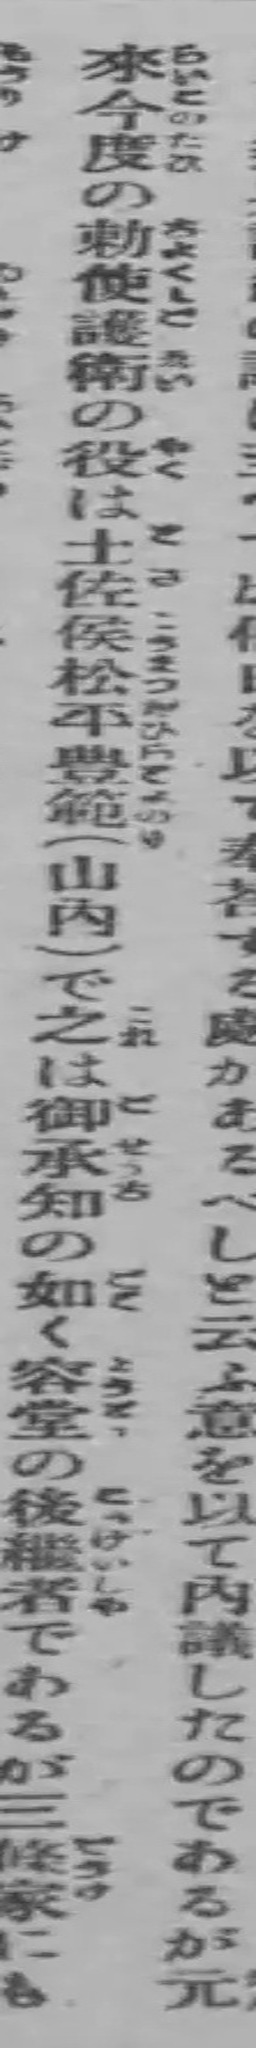来今度の勅使護衛の役は土佐侯松平豊範(山内)で之は御承知の如く容堂の後継者であるが三條家にも
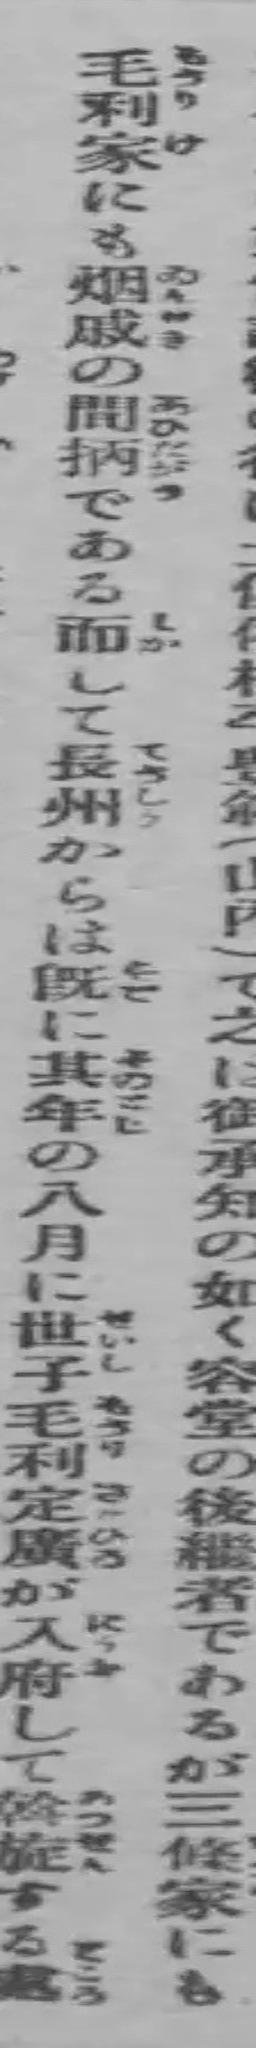毛利家にも姻戚の間柄である而して長州からは既に其年の八月に世子毛利定廣が入府して斡旋する処
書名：豊橋市史談
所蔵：国立国会図書館 National Diet Library, JAPAN
